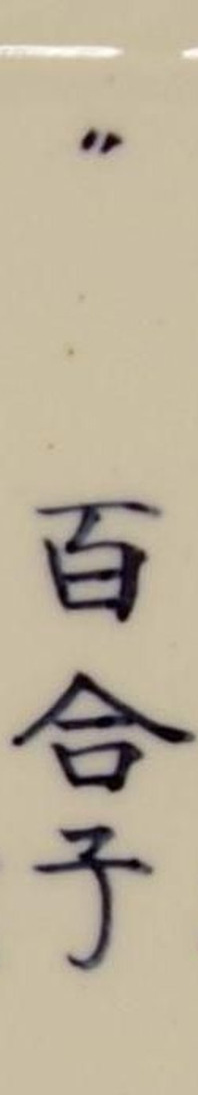百合子
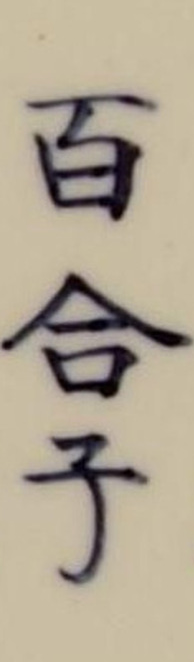百合子
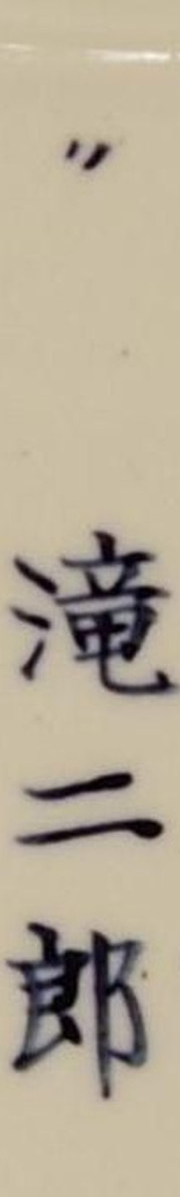滝二郎
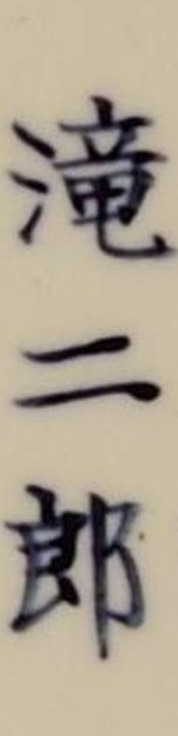滝二郎
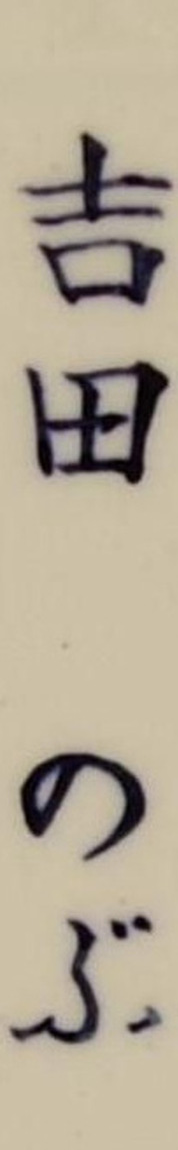吉田のぶ
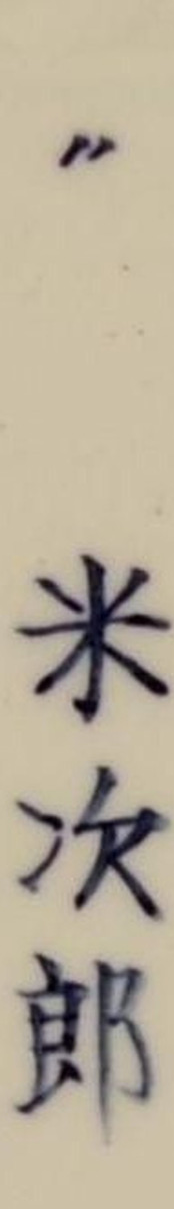米次郎
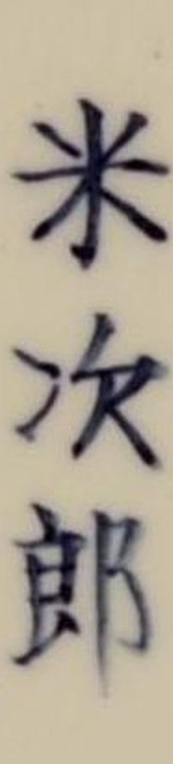米次郎
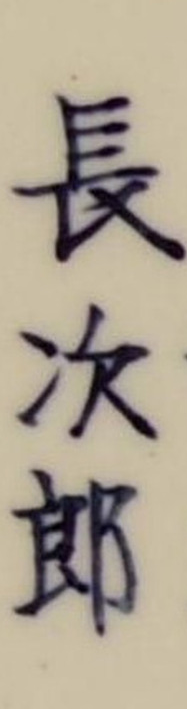長次郎
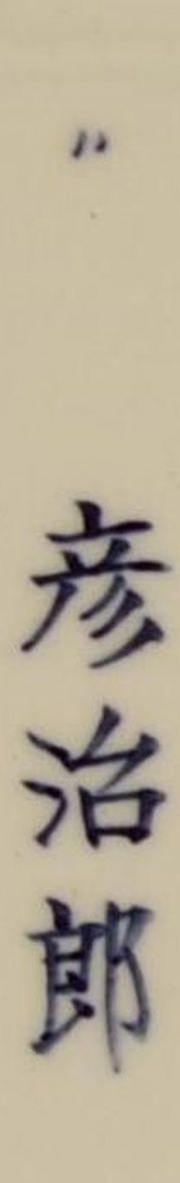彦治郎
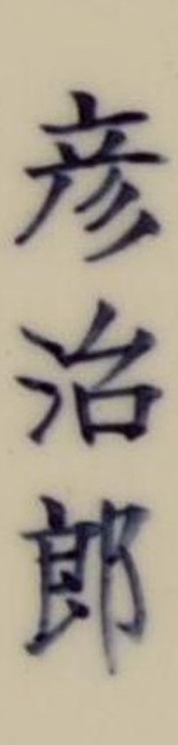彦治郎
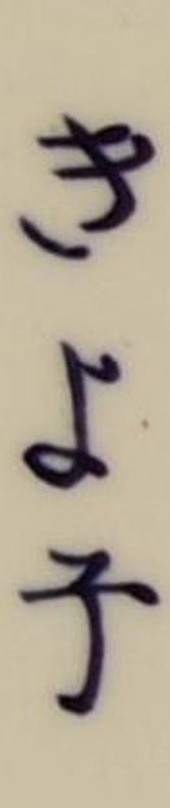きよ子
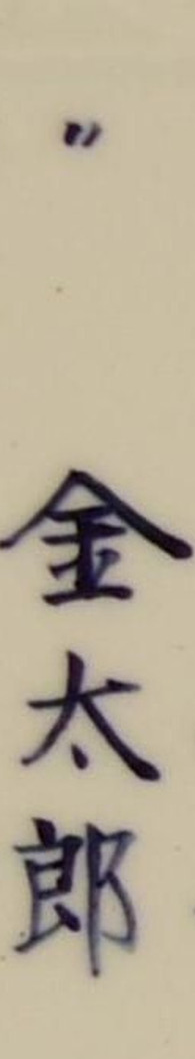金太郎
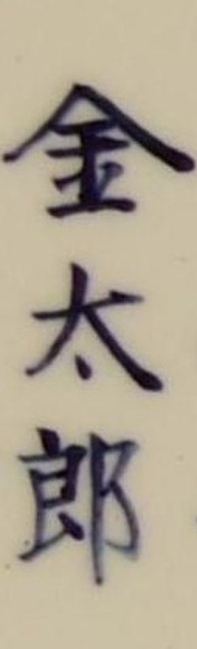金太郎
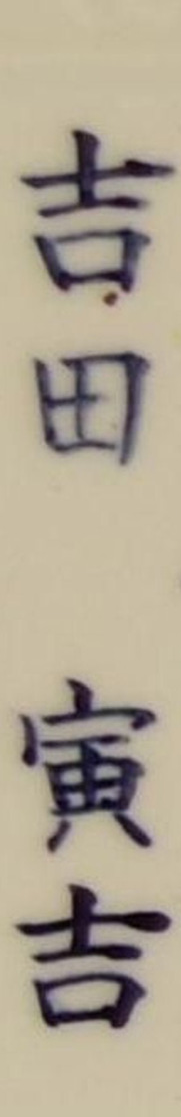吉田寅吉
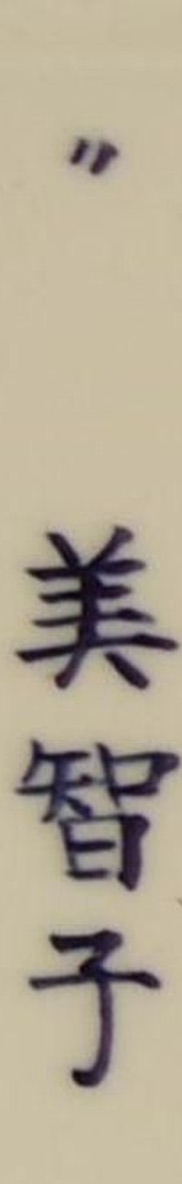美智子
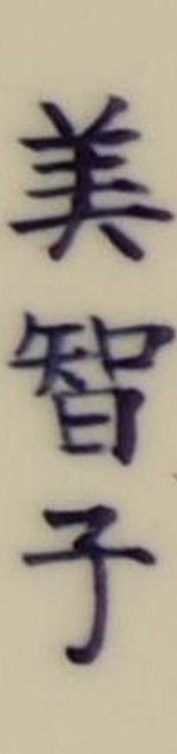美智子
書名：A~D
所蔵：koyasan kongobuji
